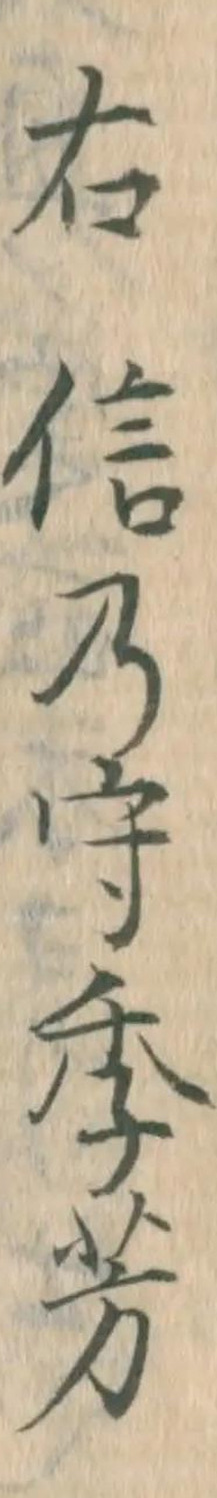右信乃守季芳
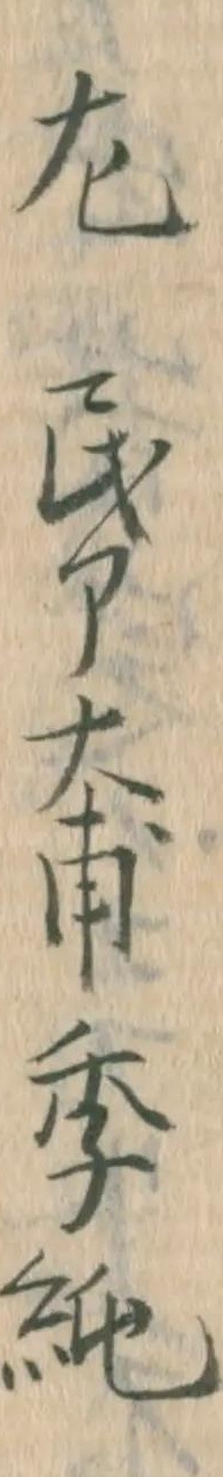左民部大輔季純
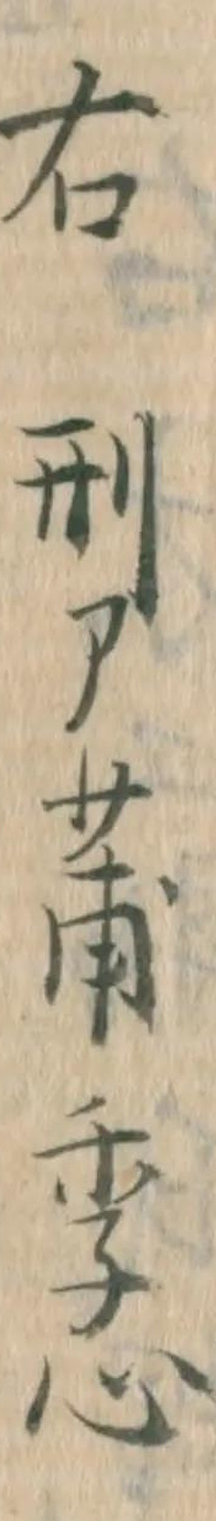右刑部少輔季心
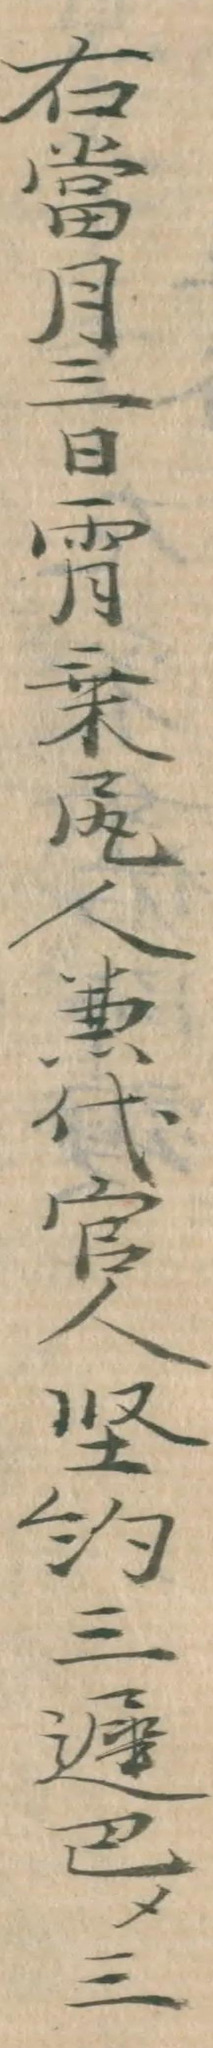右当月三日霄乗尻人兼代官人堅約三庭巴シテ三
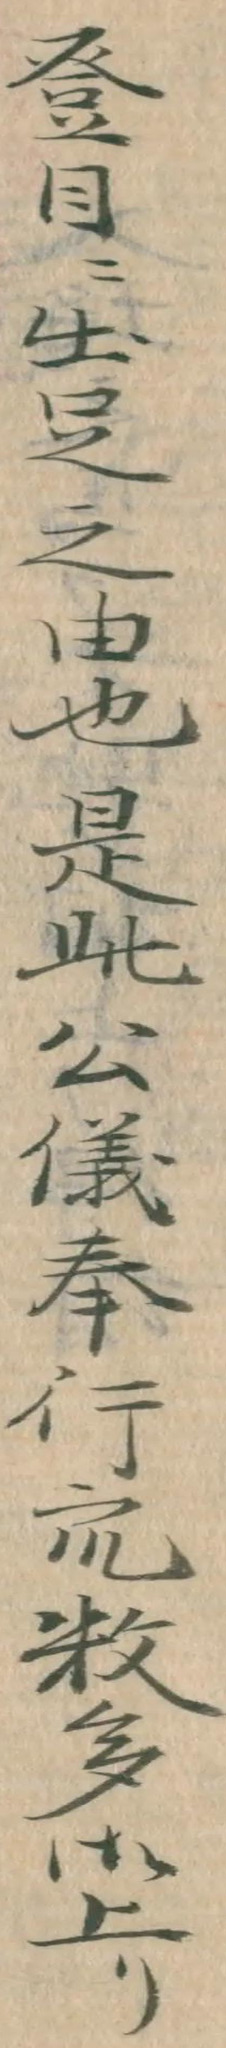登目ニ出足之由也是此公儀奉行衆数多御上リ
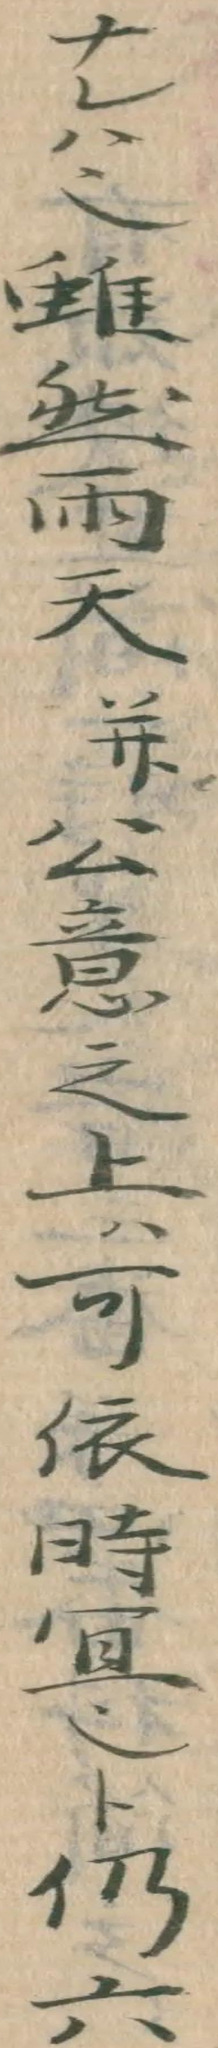ナレハ也雖然雨天并公意之上ハ可依時宜也ト仍六
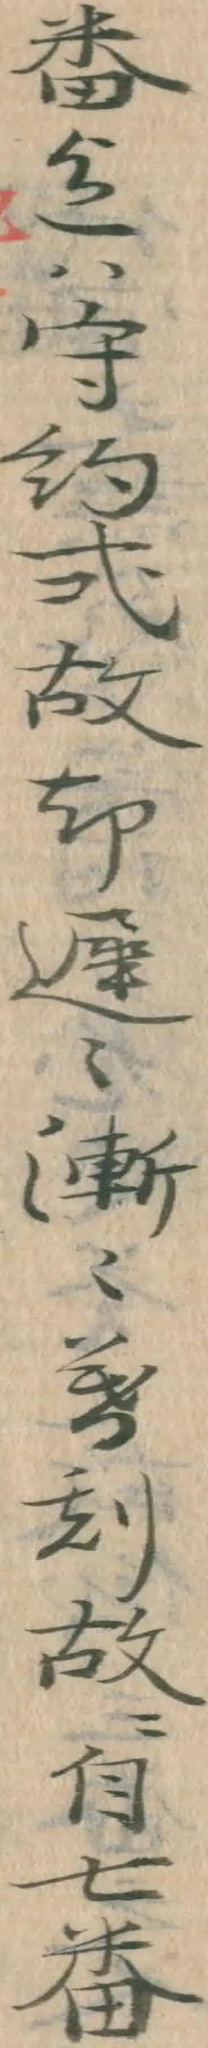番迄ハ守約式故却遅々漸々暮刻故ニ自七番
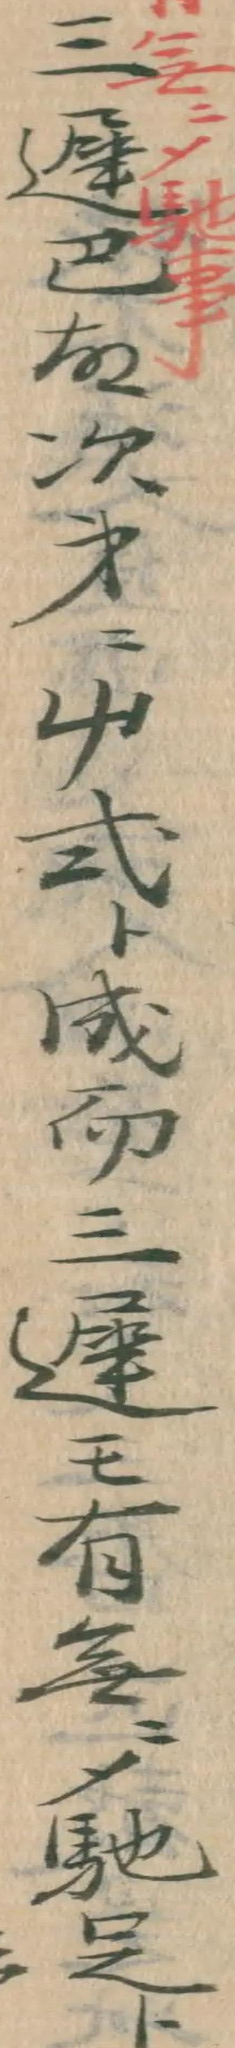三遅巴故次第ニ屮式ト成而三遅モ有無ニシテ馳足ト云々
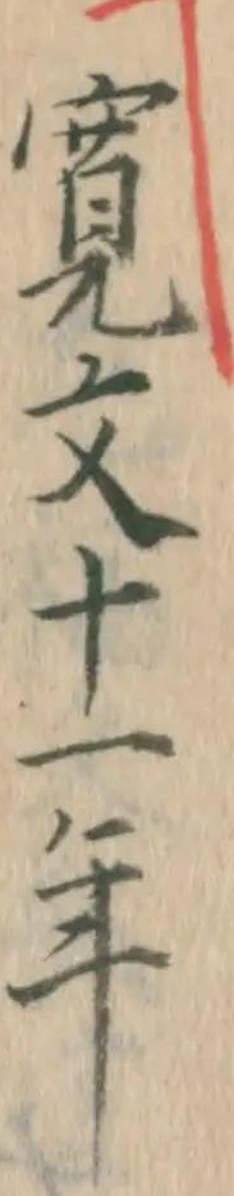寛文十一年
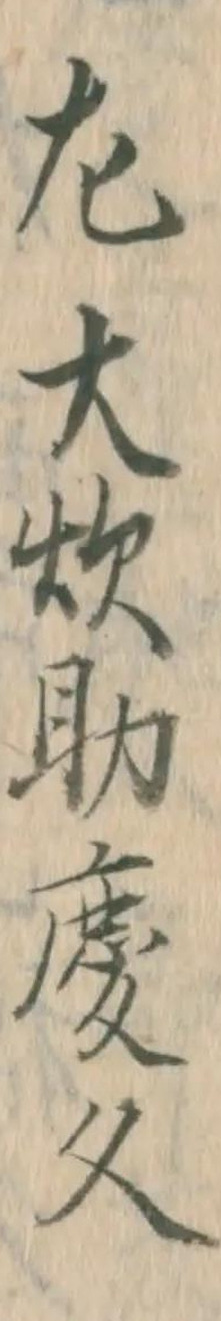左大炊助慶久
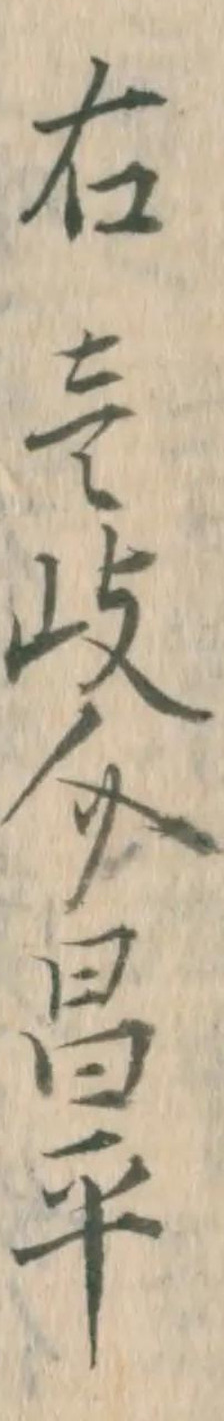右壱岐介昌平
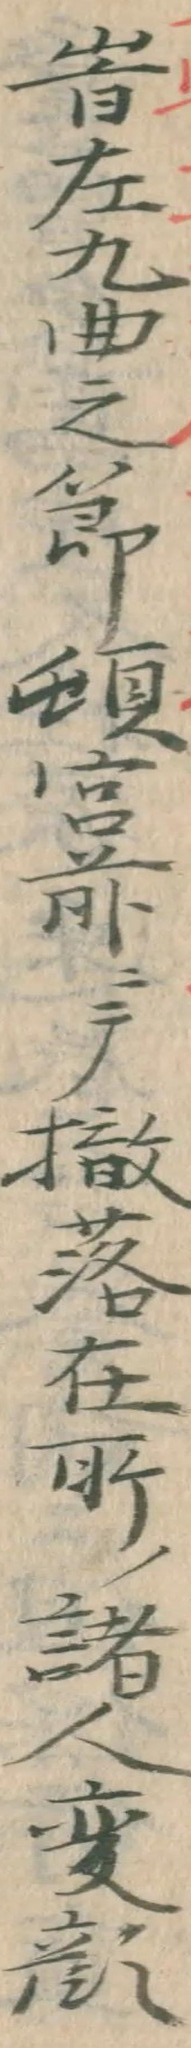旹左九曲之節頓宮前ニテ撤落在所ノ諸人変顔
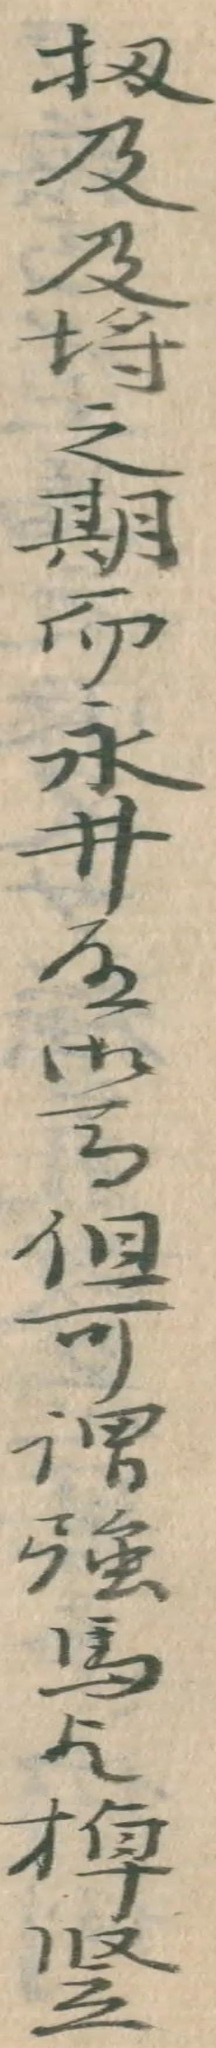扨及及埒之期而永井殿御馬但可謂強馬也棹堅
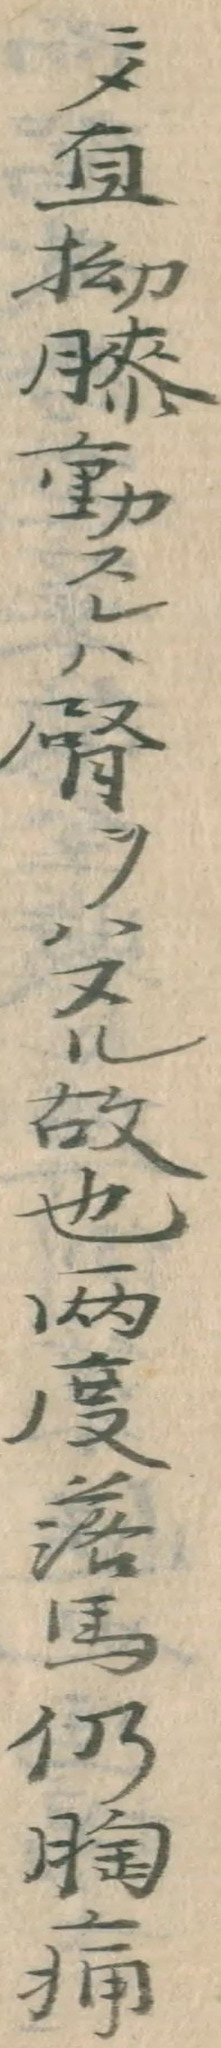ニシテ直拗膝動スレハヲハヌル故也両度落馬仍胸痛
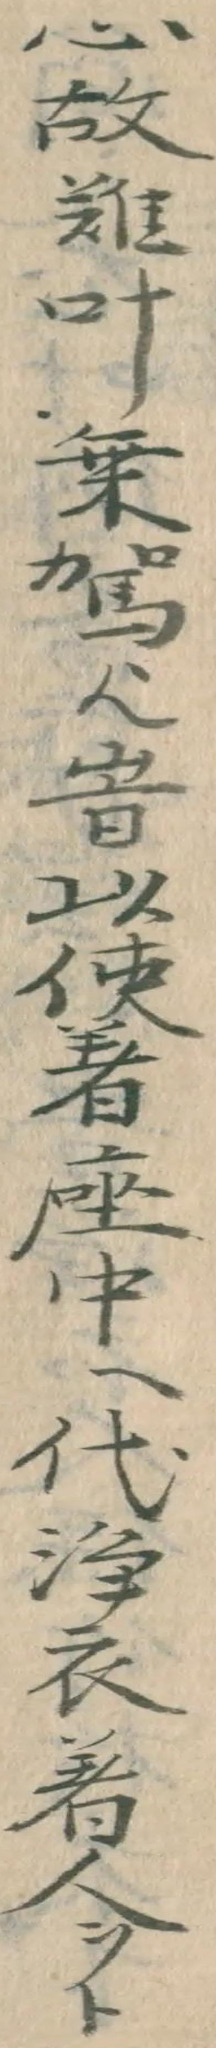心故難叶乗駕也旹以使者座中へ代浄衣着人ヲト
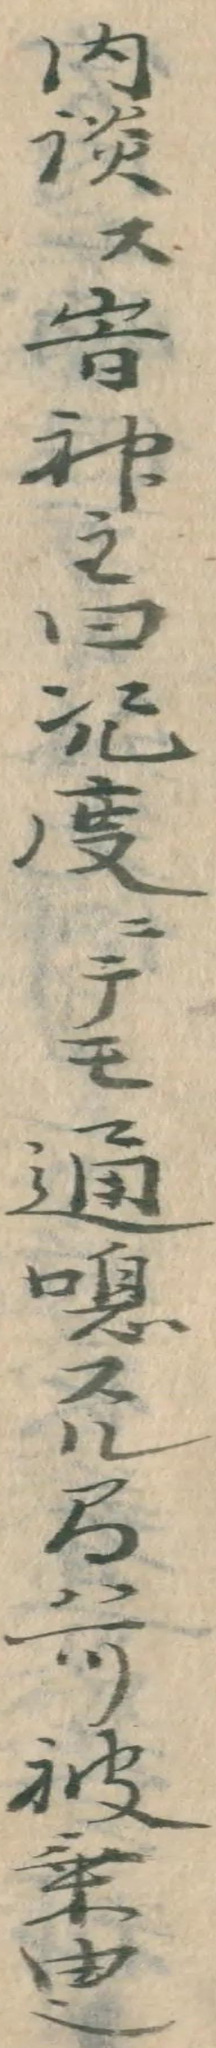内談ス旹神主曰况度ニテモ通嗅スル間ハ可被乗由也
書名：賀茂社記録. 第10冊
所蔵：国立国会図書館 National Diet Library, JAPAN
